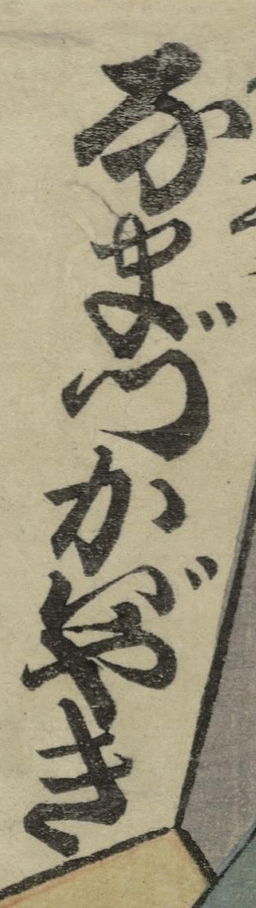なまづかばやき」
